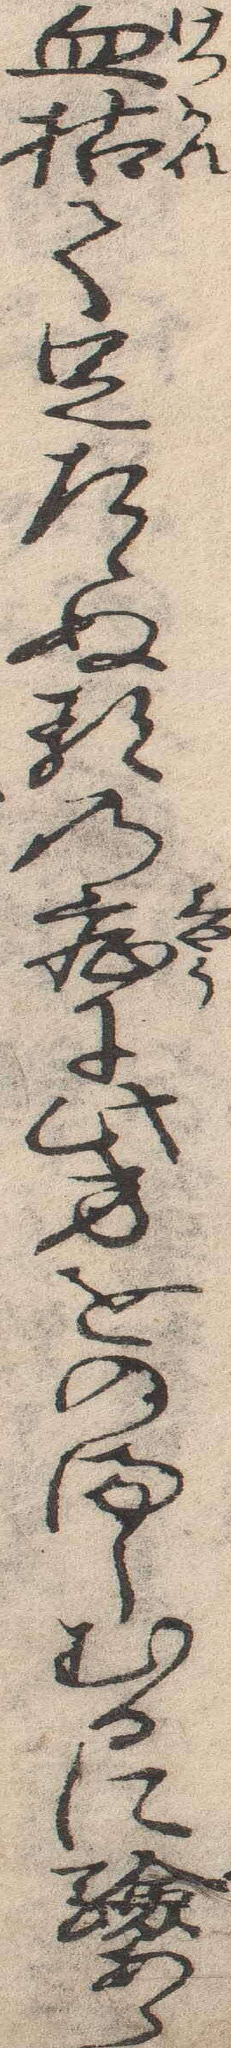血枯て足たゝぬ類の症に此方をのましむるに験あら
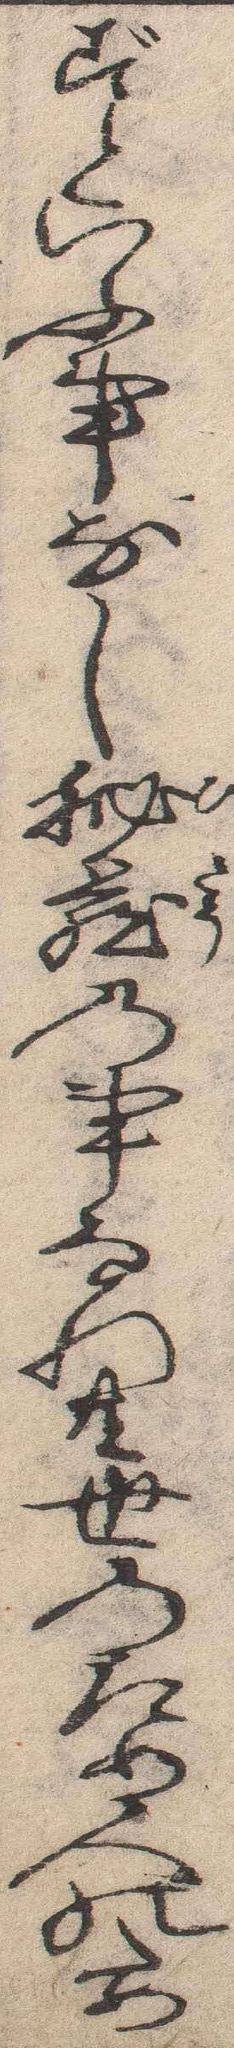ずといふ事なし秘蔵の事なれ共世のため人のため

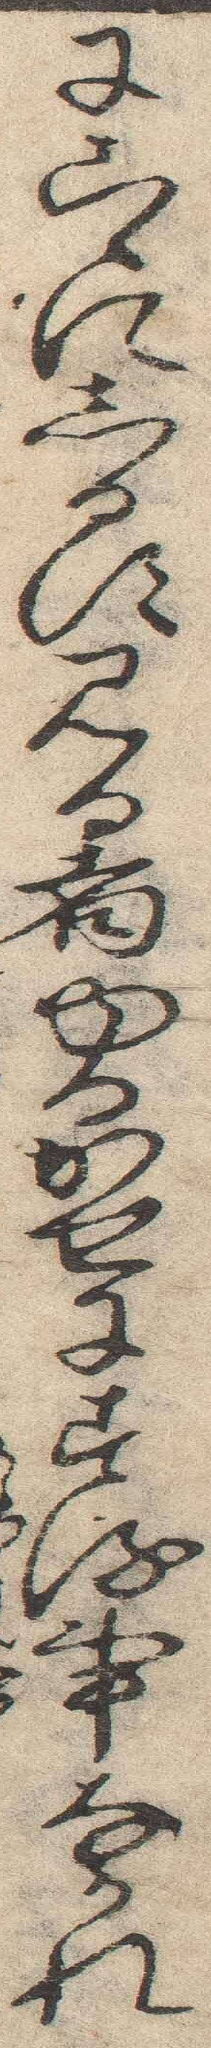にこゝにしるす見る者ゆるかせにする事なかれ
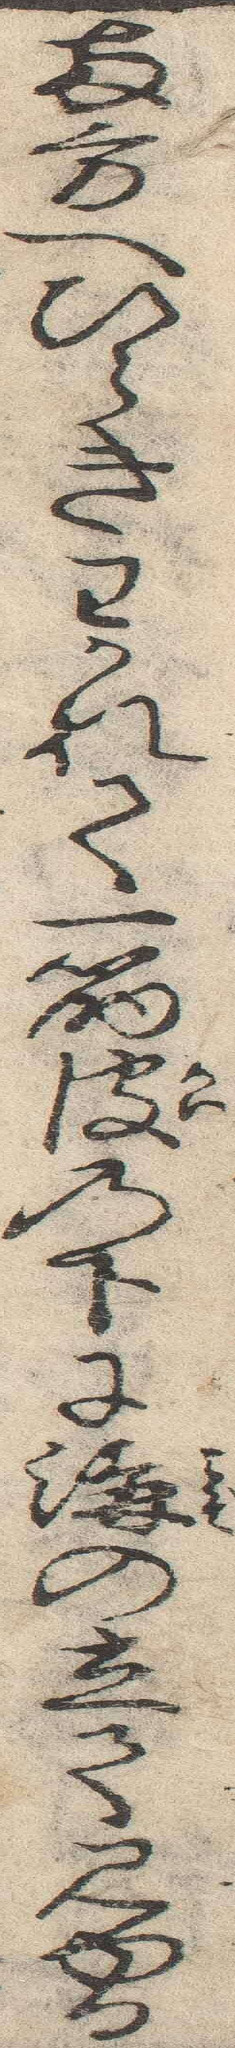両方へひらきわかれて一筋皮の下に溝の立て見ゆる
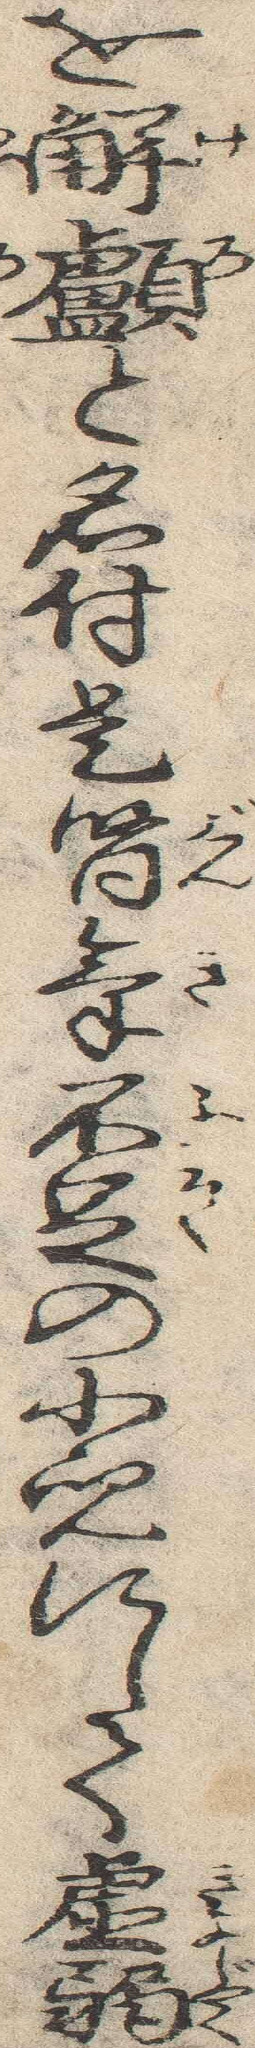を解顱と名付是腎気不足の小児にして虚弱
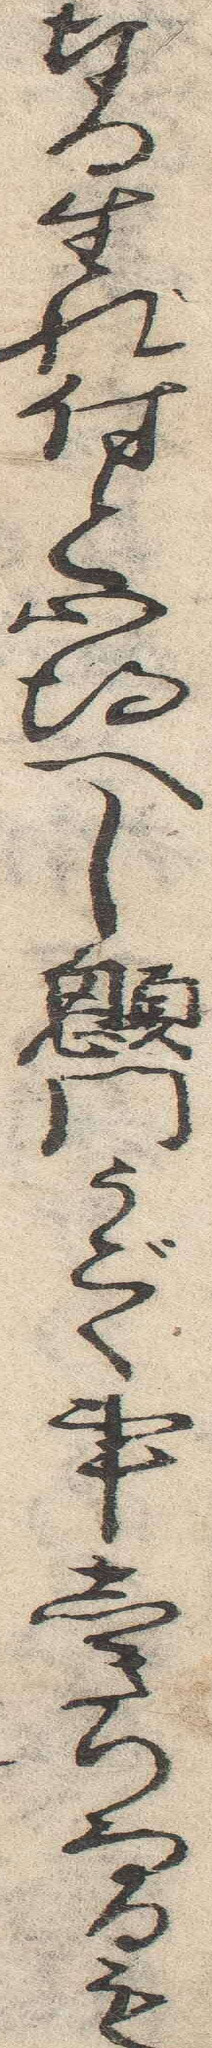なる生れ付と心得へし顖門うごく事しきりなるも
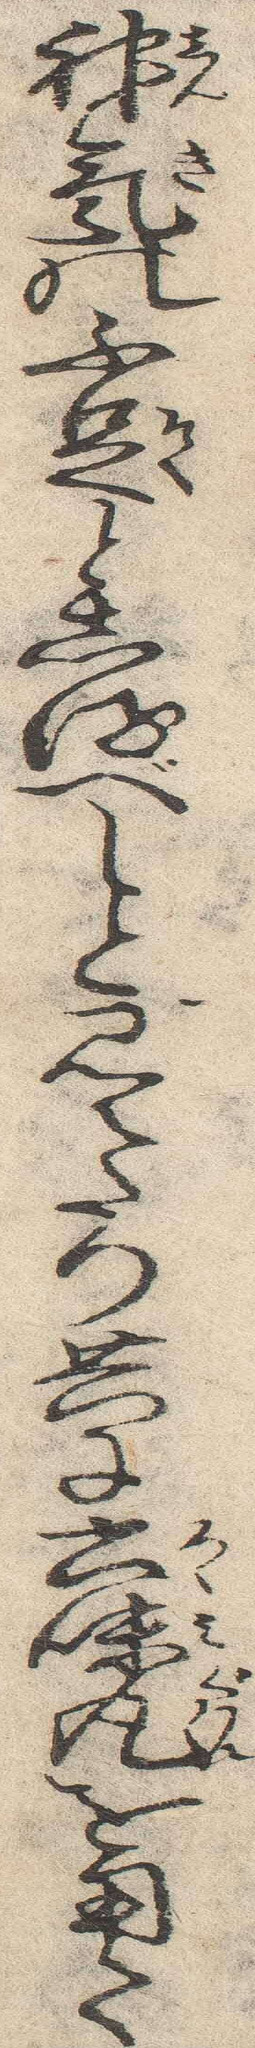神気の不足としるべしと見えたり共に六味丸を用て
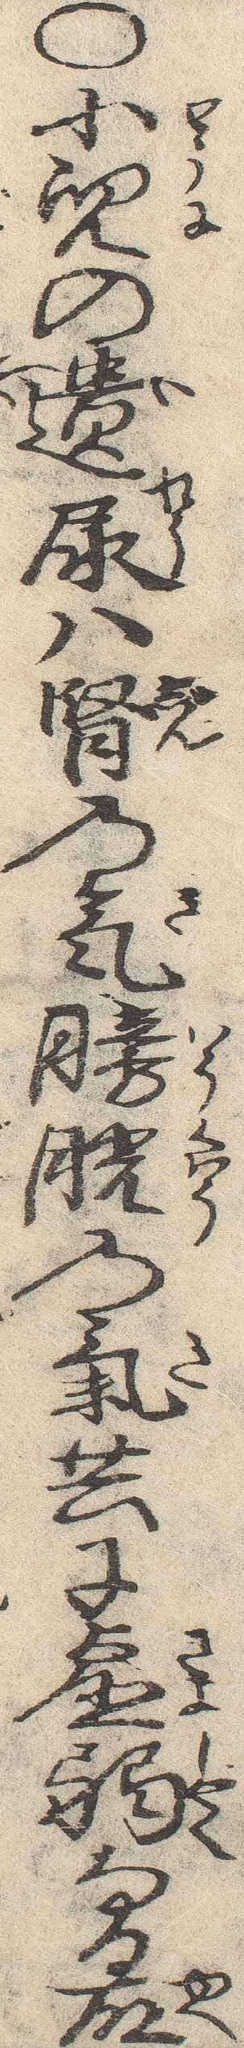○小児の遺尿は腎の気膀胱の気共に虚弱なる故
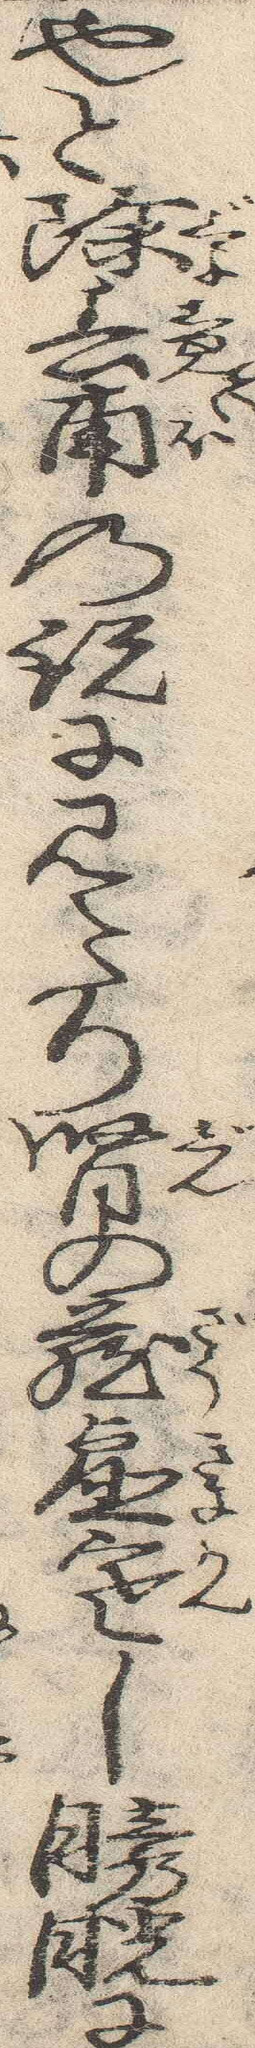也と除春甫の説に見えたり腎の蔵虚寒し膀胱に
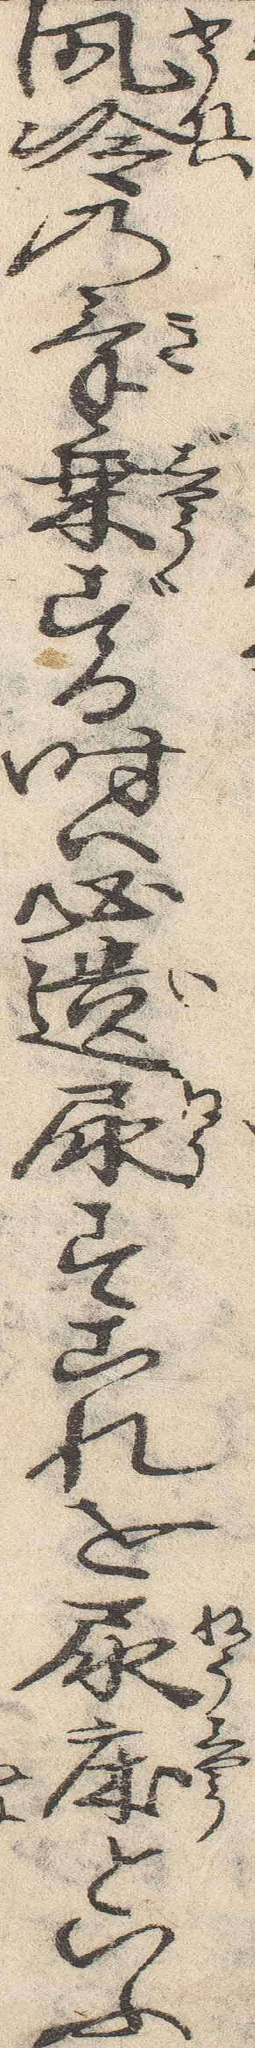風冷の気乗ずる時は必遺尿すこれを尿床といふ
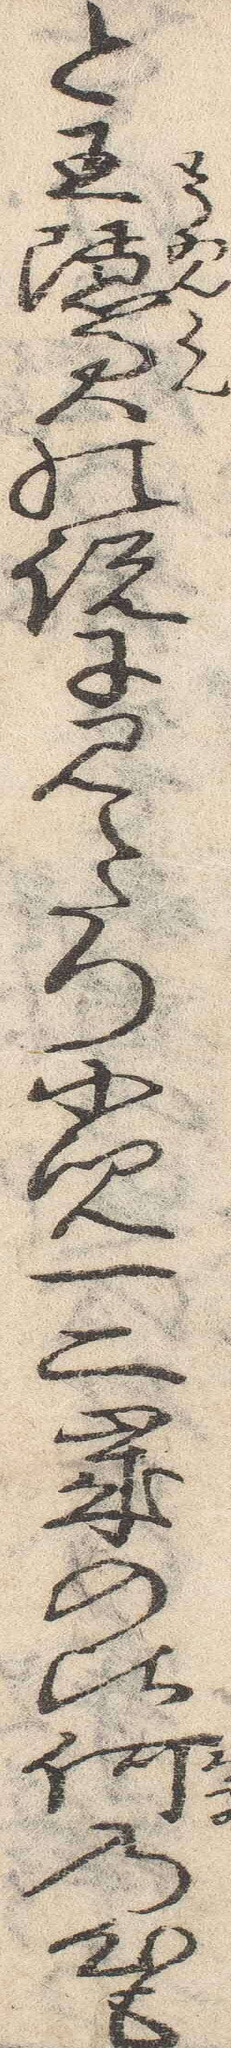と王隠君の説に見えたり小児一二歳の比何の心も

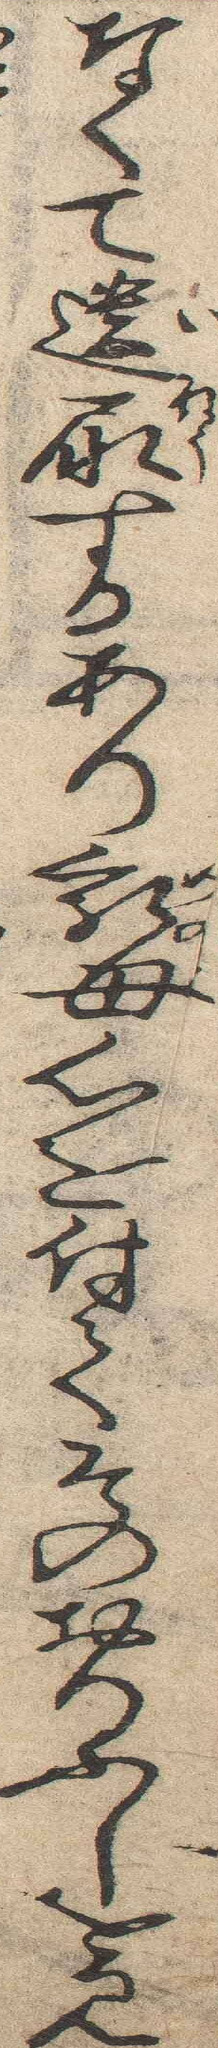なくて遺尿するあり乳母心を付てそのおりふしを見
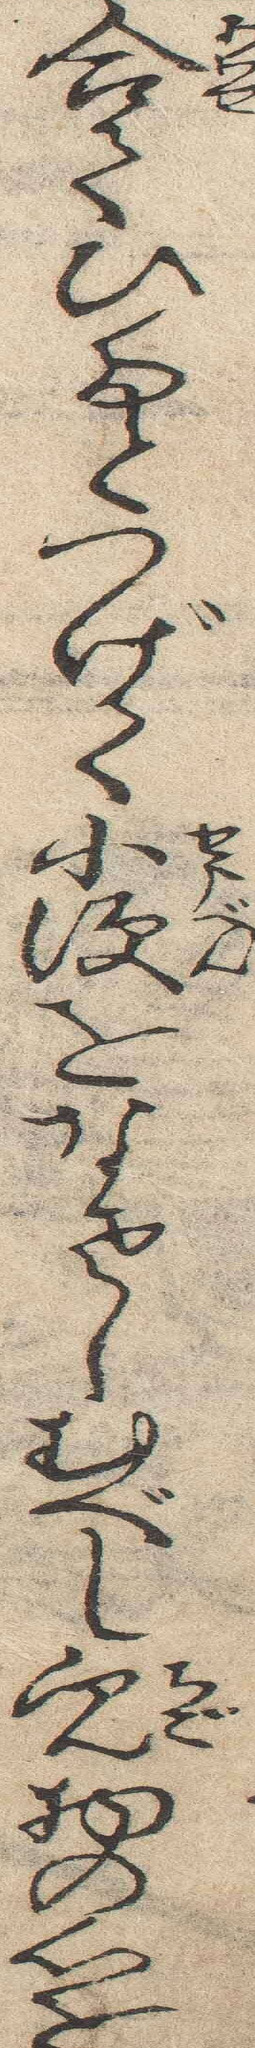合てひたとつげて小便をなさしむべし児物の心を
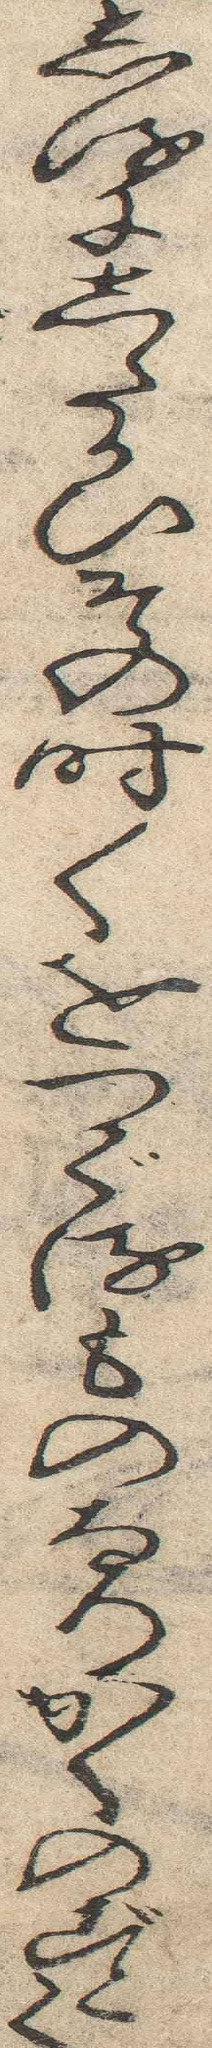しるにしたかひその時〳〵をつぐるものなりかくのごとく
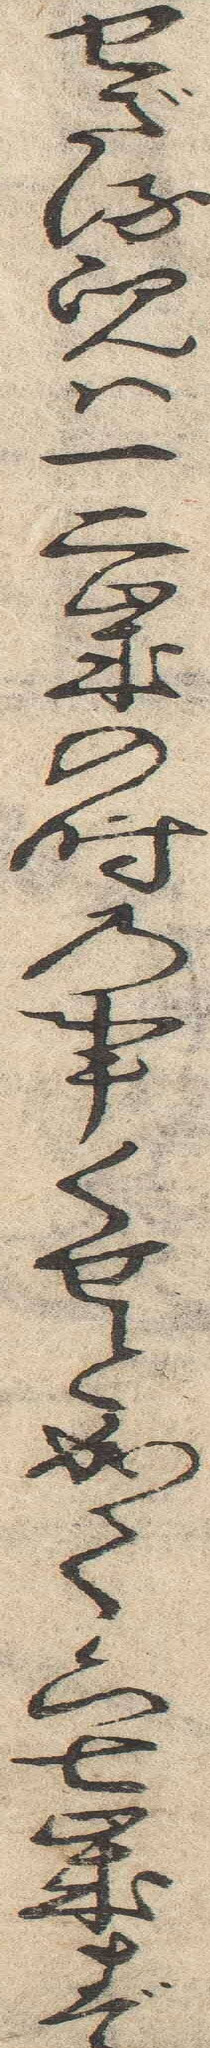せざる児は一二歳の時の事くせと成て六七歳まで
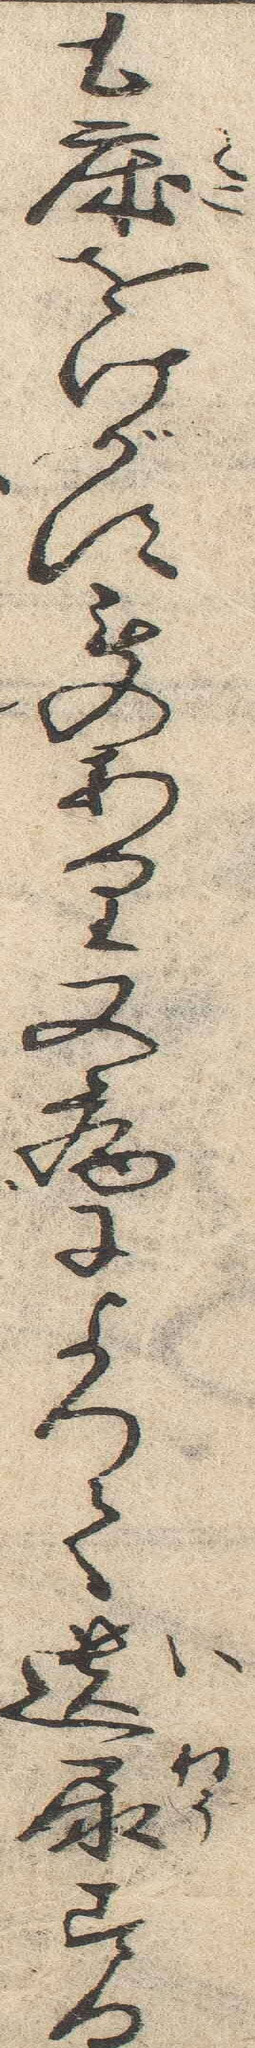も床をけがすものあり又病によりて遺尿する
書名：小児必用養育草
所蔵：東京学芸大学附属図書館 国文学研究資料館
